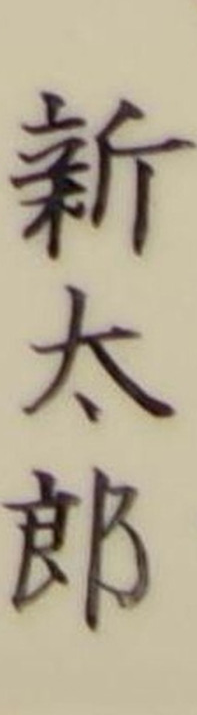新太郎
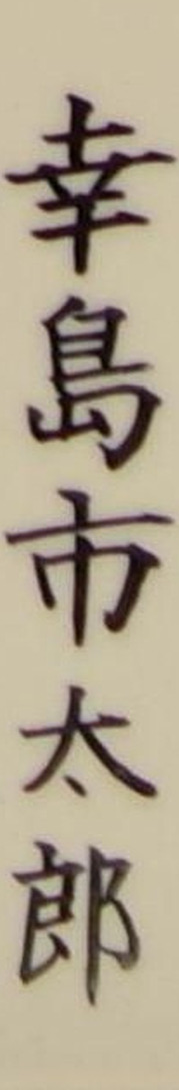幸島市太郎
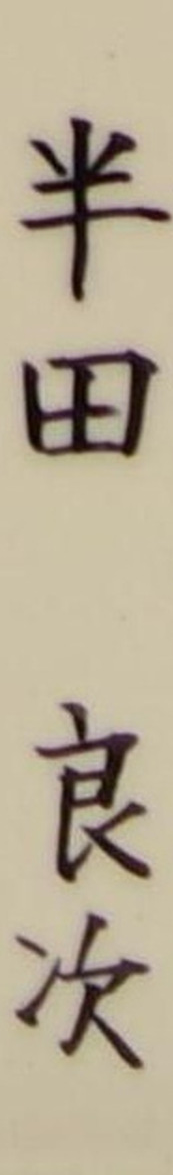半田良次
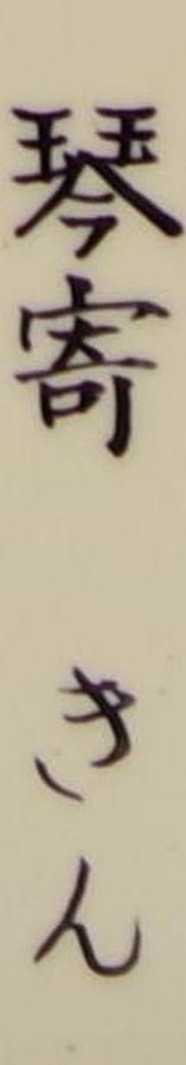琴寄きん
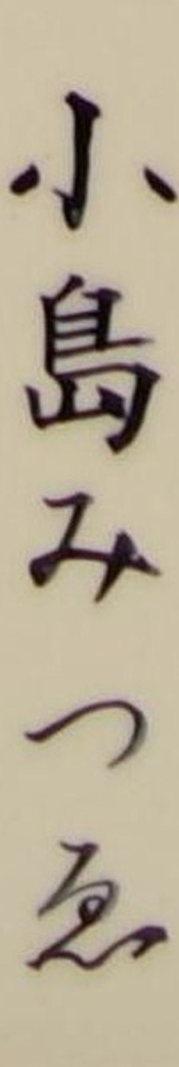小島みつえ
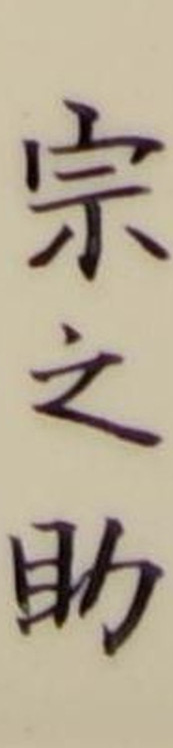宗之助
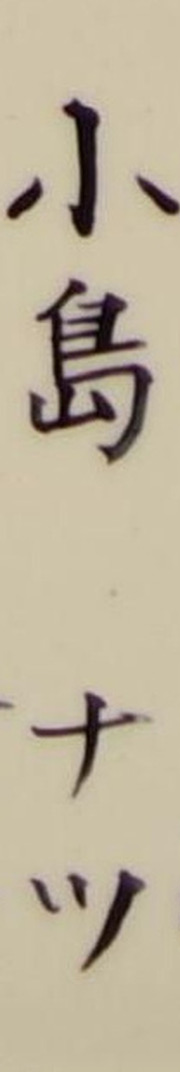小島ナツ
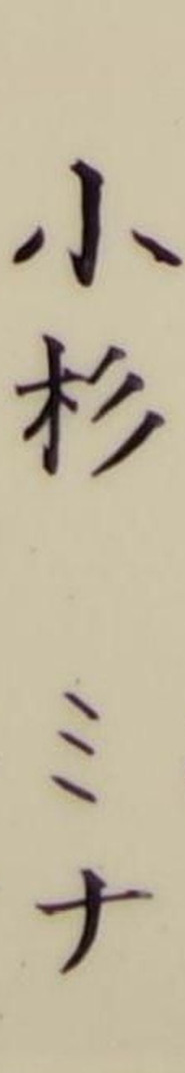小杉ミナ
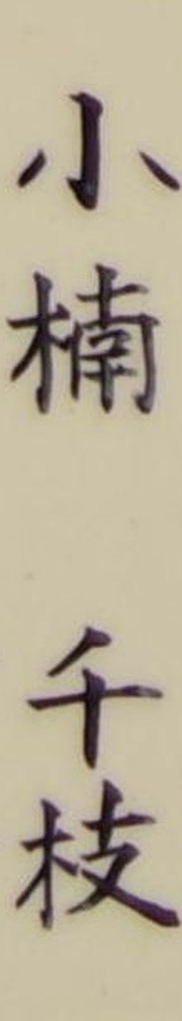小楠千枝
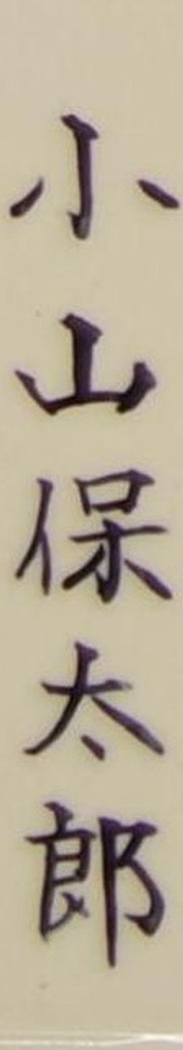小山保太郎
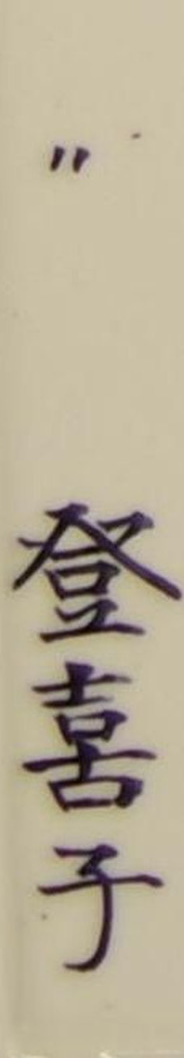登喜子
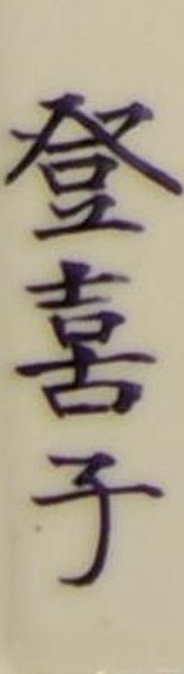登喜子

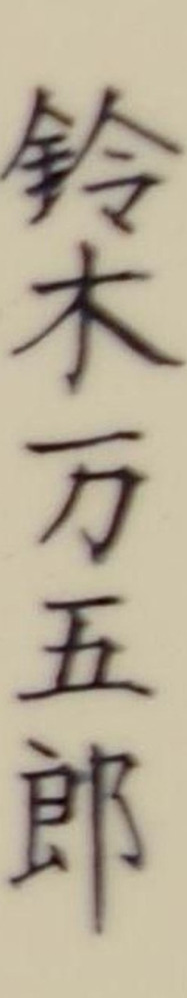鈴木万五郎
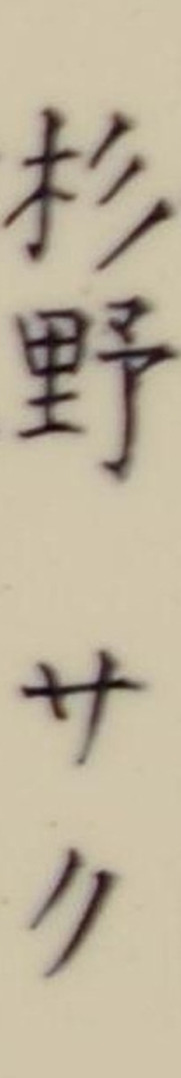杉野サク
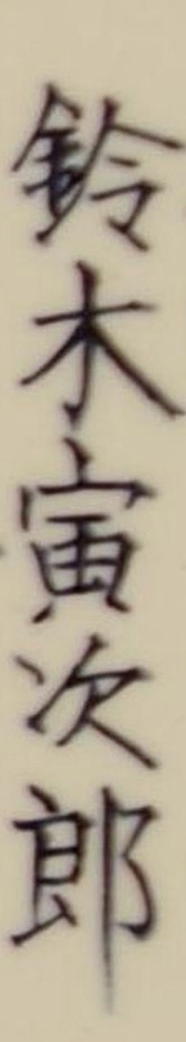鈴木寅次郎
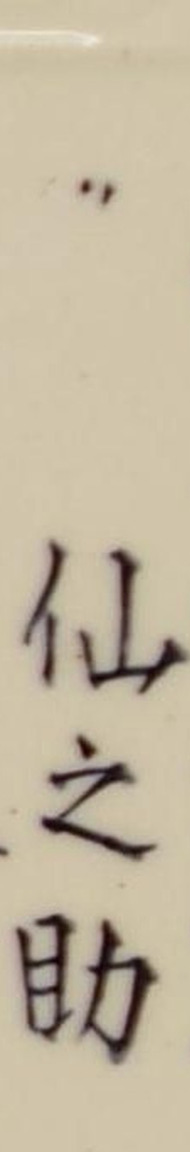仙之助
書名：E~L
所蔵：高野山金剛峯寺
